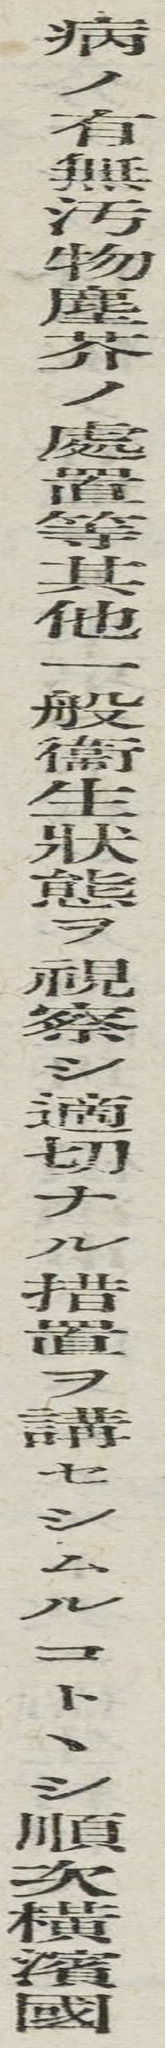病ノ有無汚物塵芥ノ処置等其他一般衛生状態ヲ視察シ適切ナル措置ヲ講セシムルコトヽシ順次横浜国
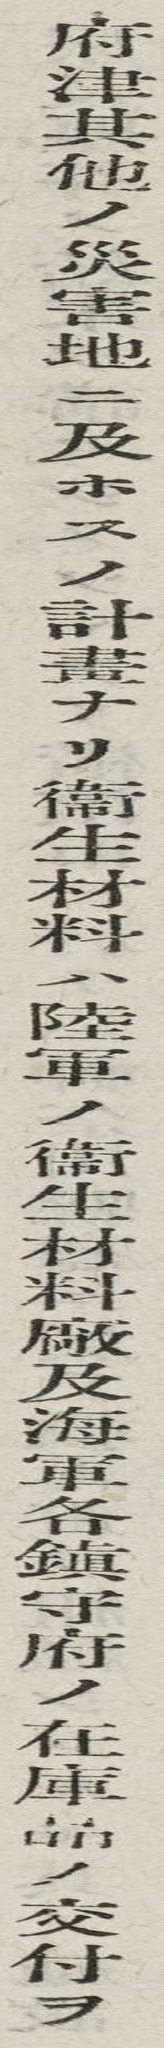府津其他ノ災害地ニ及ホスノ計画ナリ衛生材料ハ陸軍ノ衛生材料廠及海軍各鎮守府ノ在庫品ノ交付ヲ
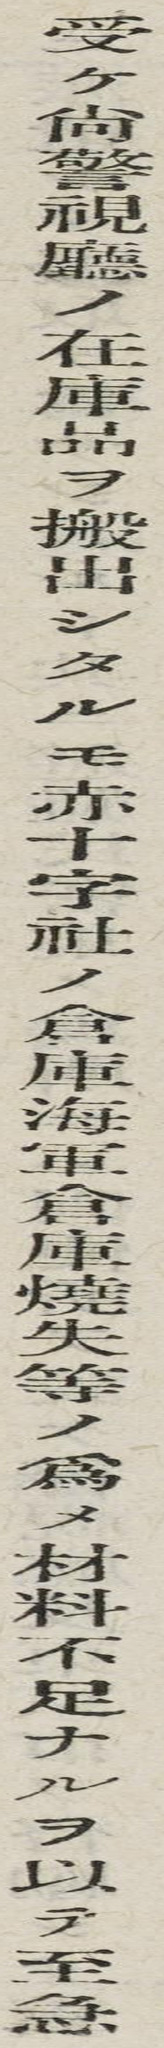受ケ尚警視庁ノ在庫品ヲ搬出シタルモ赤十字社ノ倉庫海軍倉庫焼失等ノ為メ材料不足ナルヲ以テ至急
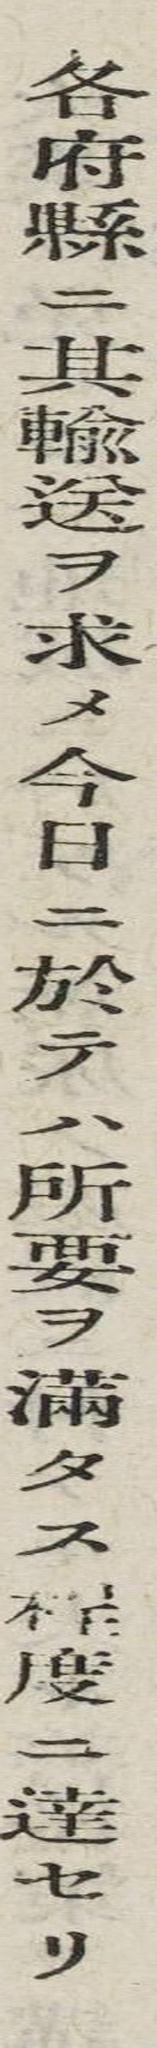各府県ニ其輸送ヲ求メ今日ニ於テハ所要ヲ満タス程度ニ達セリ

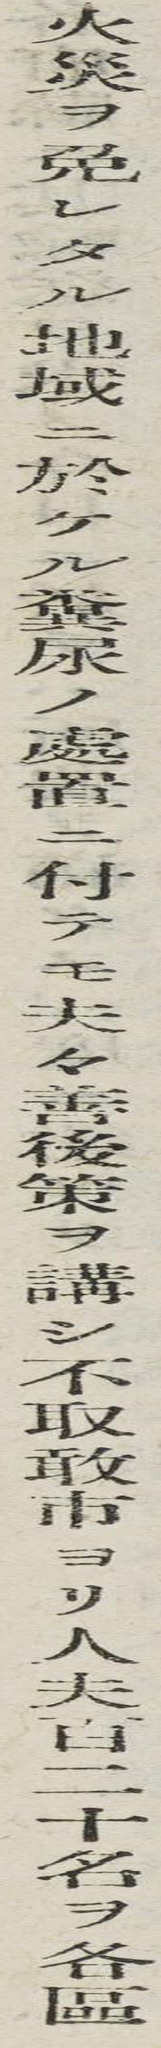火災ヲ免レタル地域ニ於ケル糞尿ノ処置ニ付テモ夫々善後策ヲ講シ不取敢市ヨリ人夫百二十名ヲ各区
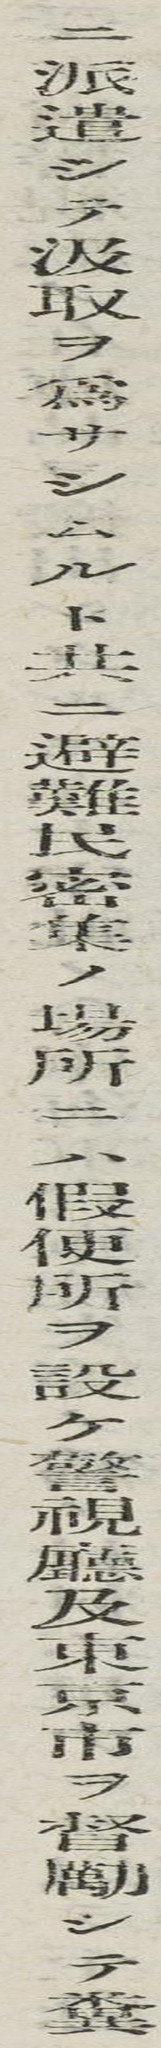ニ派遣シテ汲取ヲ為サシムルト共ニ避難民密集ノ場所ニハ仮便所ヲ設ケ警視庁及東京市ヲ督励シテ糞
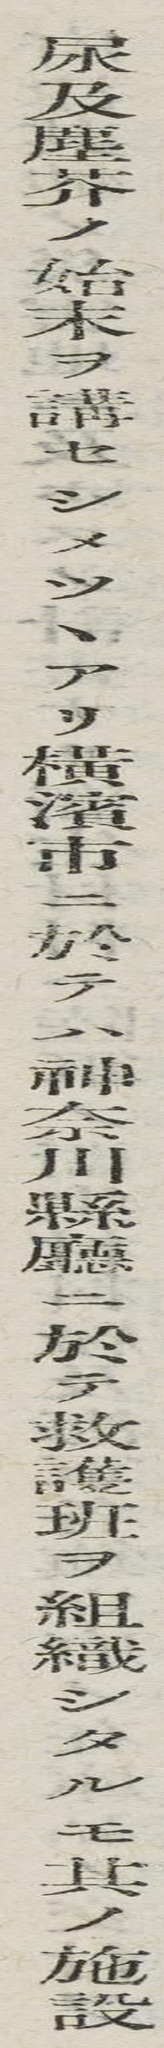尿及塵芥ノ始末ヲ講セシメツヽアリ横浜市ニ於テハ神奈川県庁ニ於テ救護班ヲ組織シタルモ其ノ施設
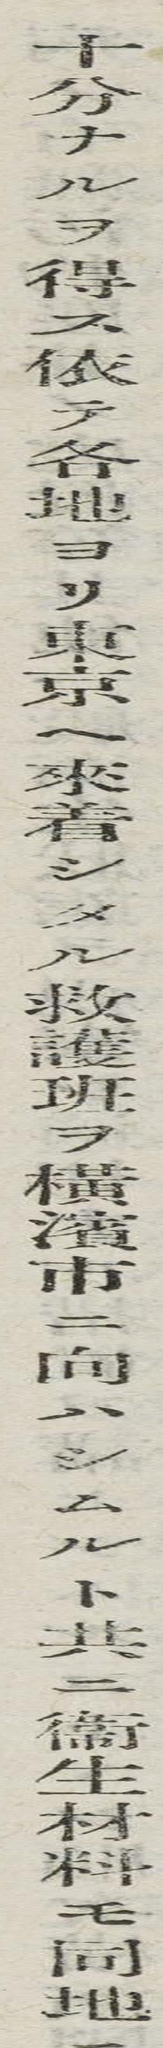十分ナルヲ得ス依テ各地ヨリ東京ヘ来着シタル救護班ヲ横浜市ニ向ハシムルト共ニ衛生材料モ同地ニ
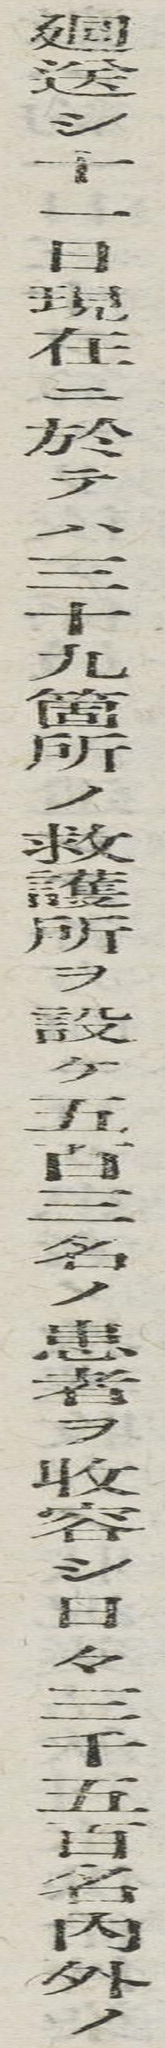廻送シ十一日現在ニ於テハ三十九箇所ノ救護所ヲ設ケ五百三名ノ患者ヲ収容シ日々三千五百名内外ノ
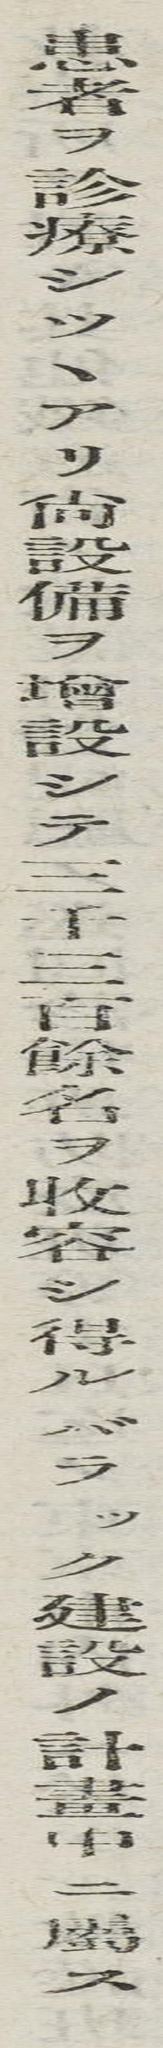患者ヲ診療シツヽアリ尚設備ヲ増設シテ三千三百名ヲ収容シ得ルバラック建設ノ計画中ニ属ス
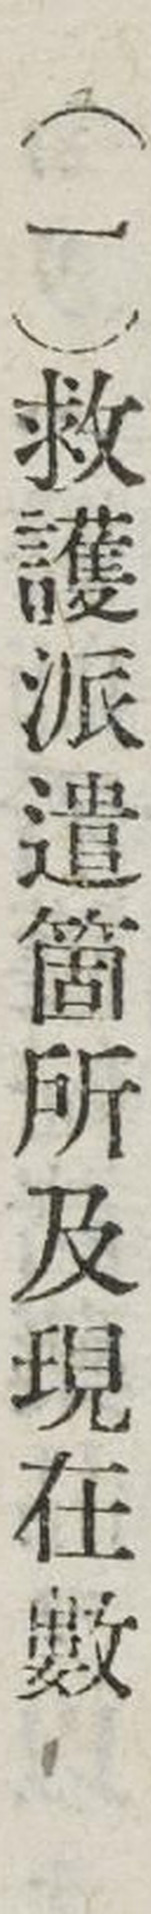救護派遣箇所及現在数
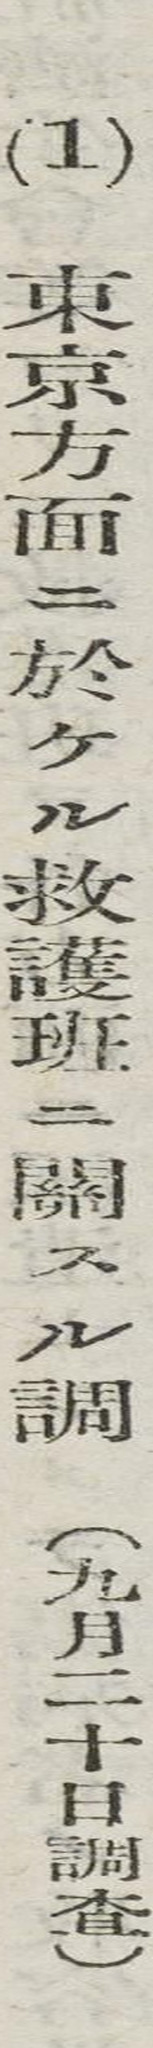⑴東京方面ニ於ケル救護班ニ関スル調
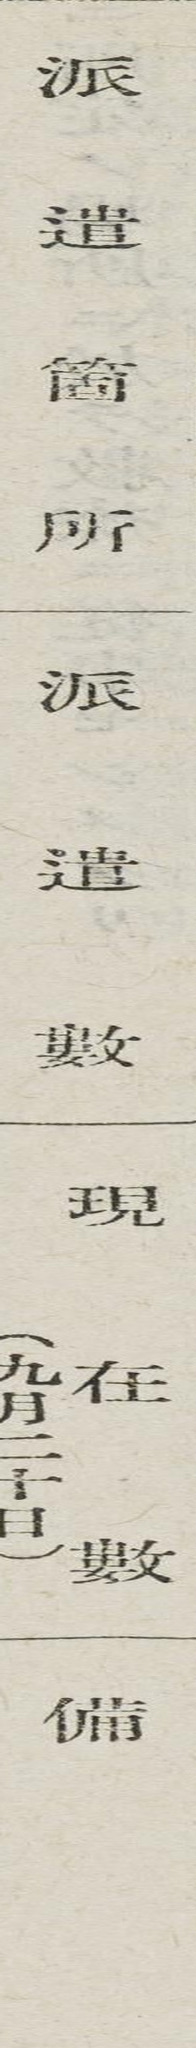派遣箇所派遣数現在数備考
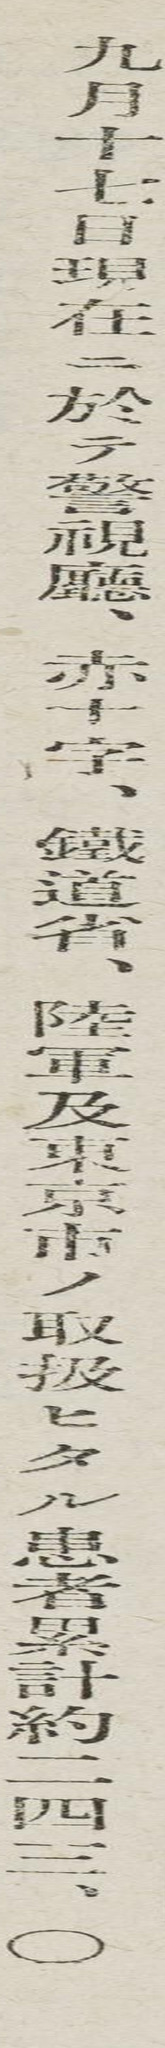九月十七日現在ニ於テ警視庁、赤十字、鉄道省、陸軍及東京市ノ取扱ヒタル患者累計約二四三、〇
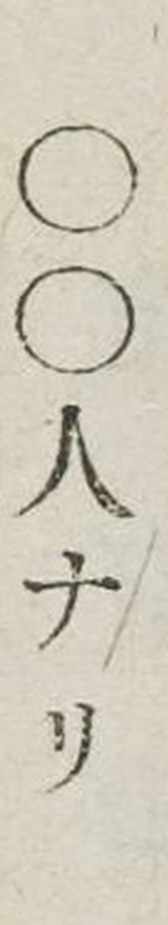〇〇人ナリ

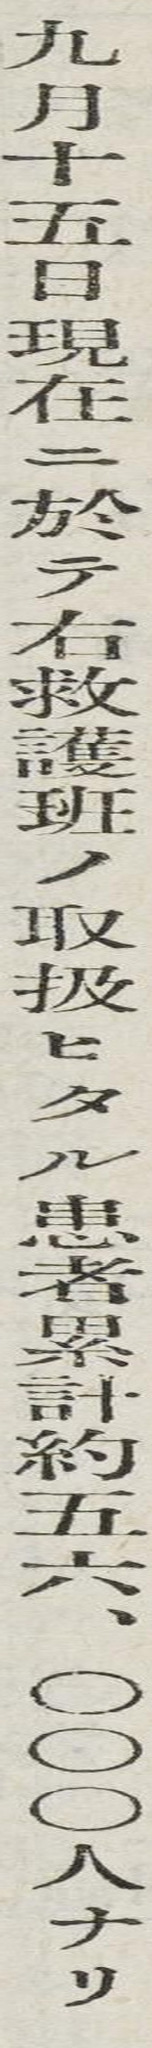九月十五日現在ニ於テ右救護班ノ取扱ヒタル患者累計約五六、〇〇〇人ナリ
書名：震災被害状況並救護施設概要
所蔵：東京大学地震研究所図書室 Earthquake Research Institute Library, The University of Tokyo, JAPAN
